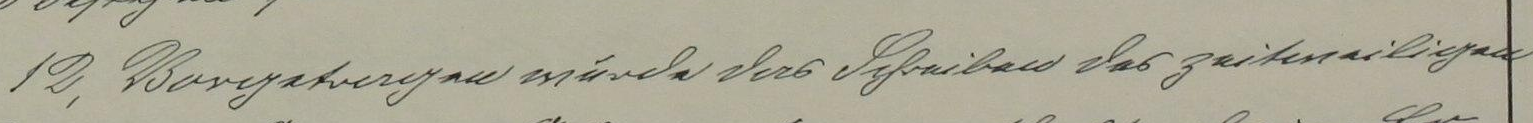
12. Vorgetragen wurde das Schreiben des zeitweiligen
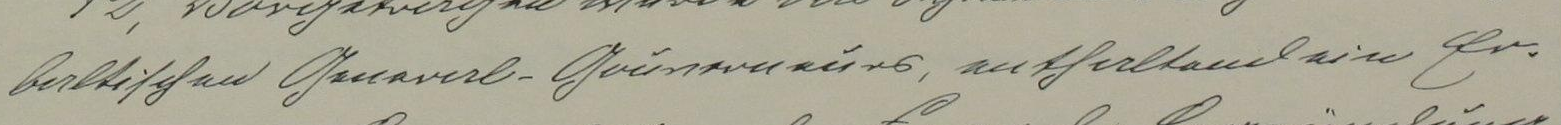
baltischen General-Gouverneurs, enthaltend ein Er-
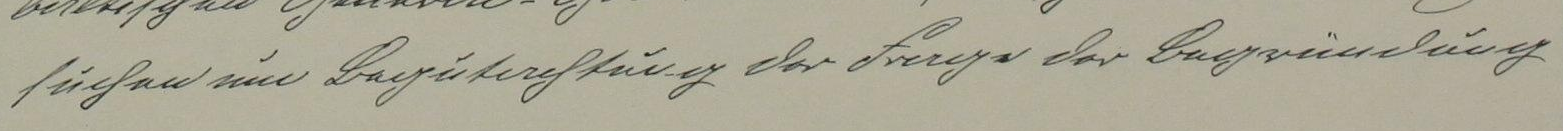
suchen um Begutachtung der Frage der Begründung
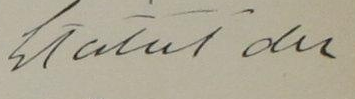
Statut der
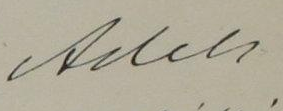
Adels
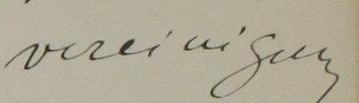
vereinigung
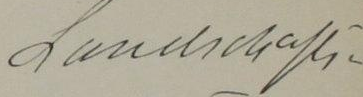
Landschafts
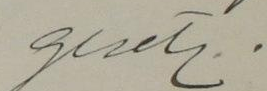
gesetz
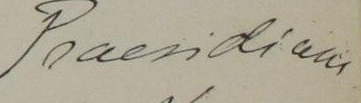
Praesidium
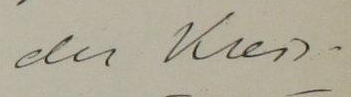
der Kreis
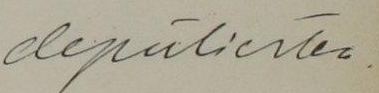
deputierten
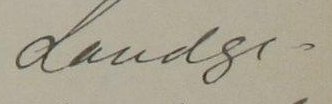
Landge-
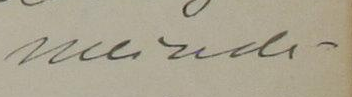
meinde-
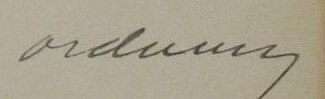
ordnung
